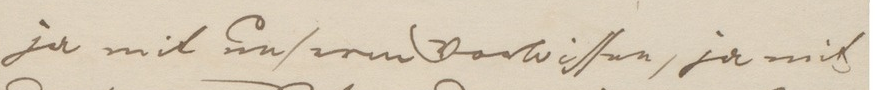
ja mit unserm Vorwissen, ja mit
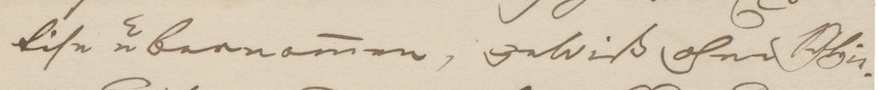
tise übernommen, gewiß ohne Schwie-
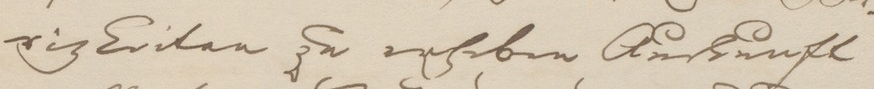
rigkeiten zu erheben Auskunft
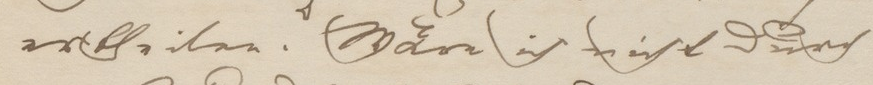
ertheilen. Wäre ich nicht durch
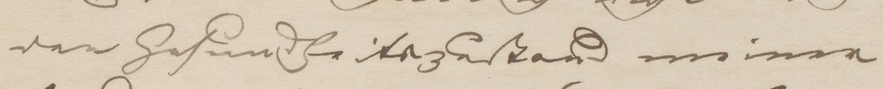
den Gesundheitszustand meiner
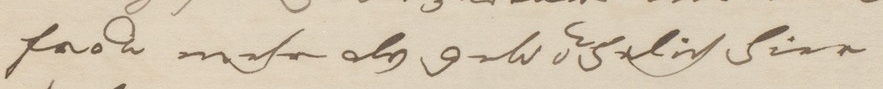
Frau mehr als gewöhnlich hier
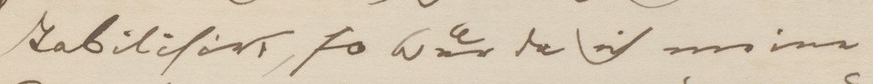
stabilisirt, so würde ich meine
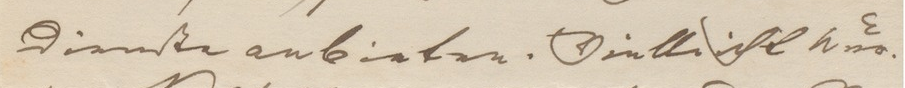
Dienste anbieten. Vielleicht wür-
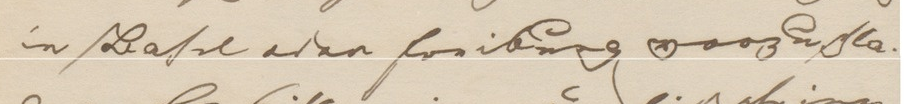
in Basel oder Freiburg vorzuschla-
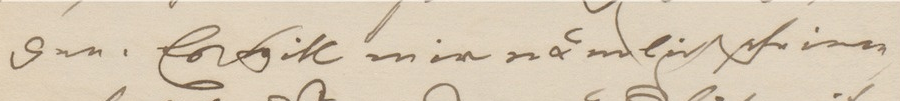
gen. Es will mir nämlich scheinen,
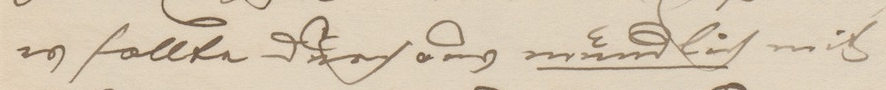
es sollte durchaus mündlich mit
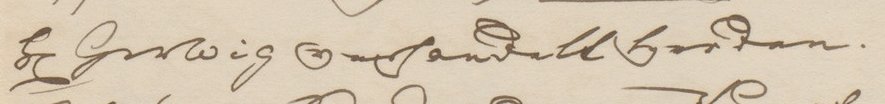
Herrn Gerwig verhandelt werden.
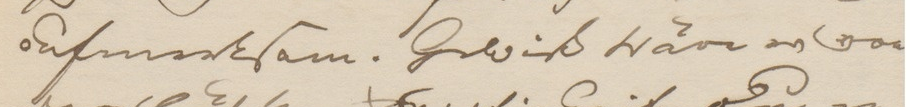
aufmerksam. Gewiß wäre es von
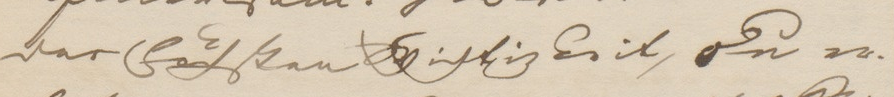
der höchsten Wichtigkeit, zu er-
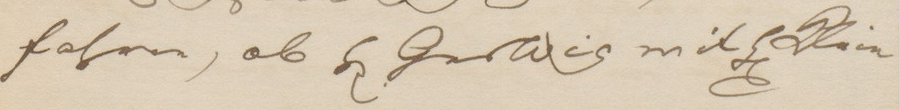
fahren, ob H. Gerwig mit Herrn Klein
